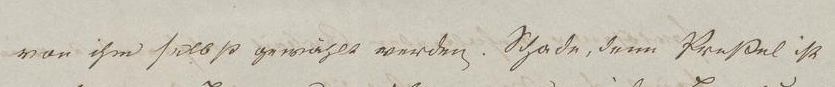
von ihm selbst gewählt werden. Schade, denn Preßel ist
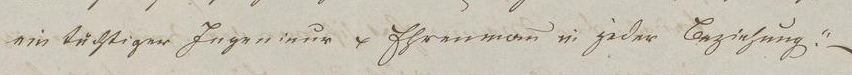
ein tüchtiger Ingenieur & Ehrenmann in jeder Beziehung.» –
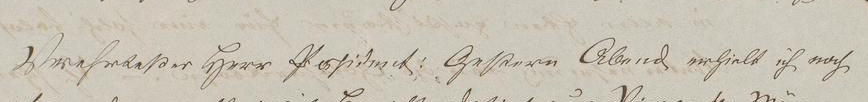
Verehrtester Herr Präsident: Gestern Abend erhielt ich noch
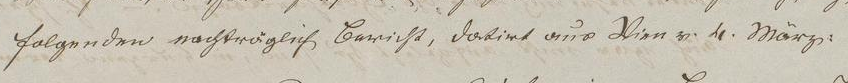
folgenden nachträglichen Bericht, datirt aus Wien v. 4. März:
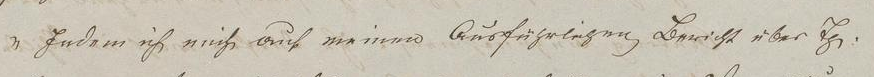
«Indem ich mich auf meinen Ausführlichen Bericht über Th.
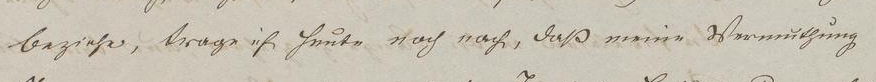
beziehe, trage ich heute noch nach, daß meine Vermuthung
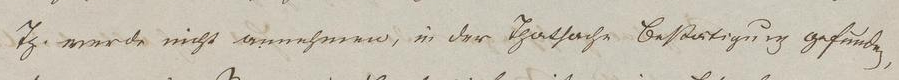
Th. werde nicht annehmen, in der Thatsache Bestätigung gefunden,
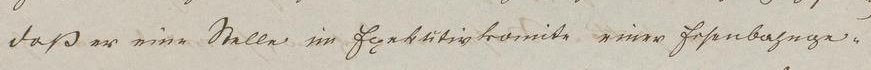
daß er eine Stelle im Exekutivkomite einer Eisenbahnge-
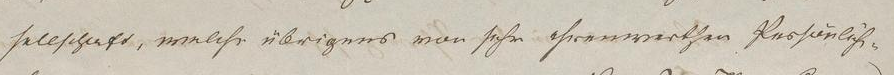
sellschaft, welche übrigens von sehr ehrenwerthen Persönlich-
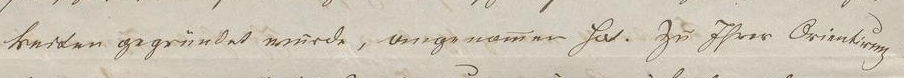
keiten gegründet wurde, angenommen hat. Zu Ihrer Orientirung
